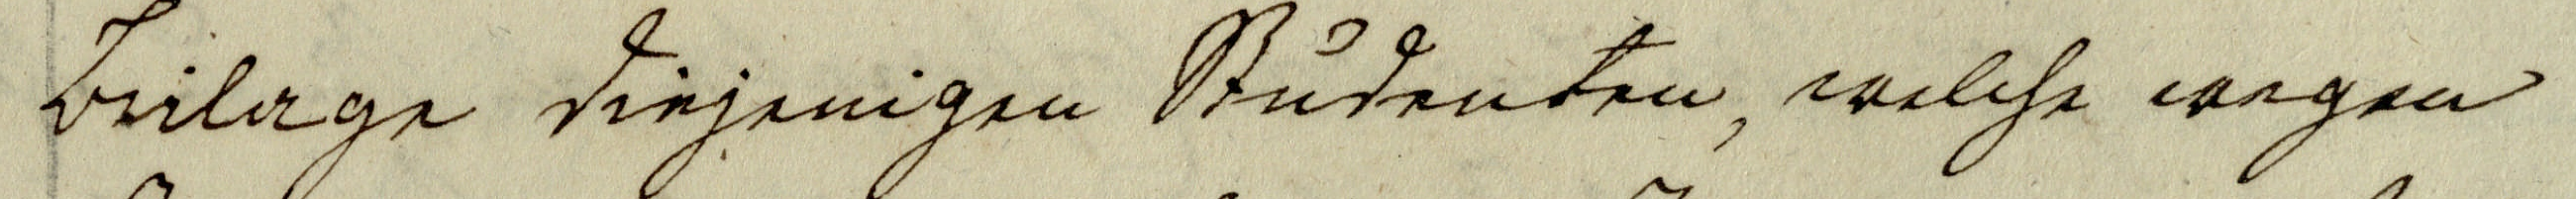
Beilage diejenigen Studenten, welche wegen
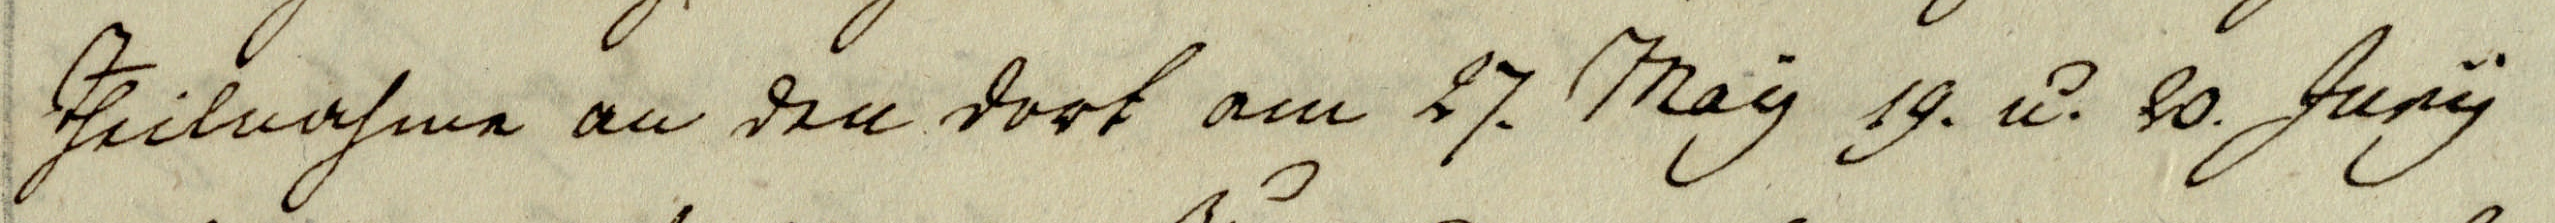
Teilnahme an den dort am 27. Maÿ 19. u. 20. Junÿ
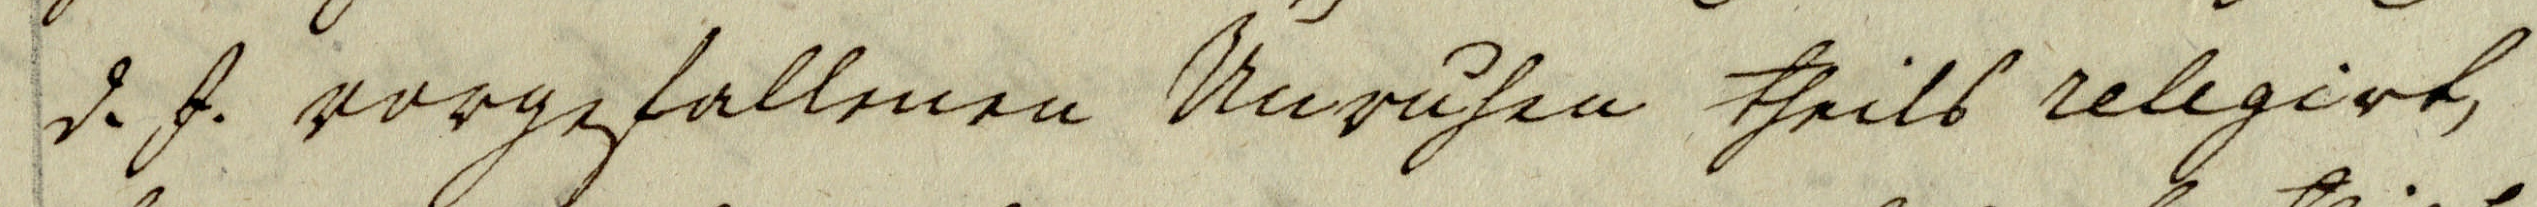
d. J. vorgefallenen Unruhen theils relegirt,
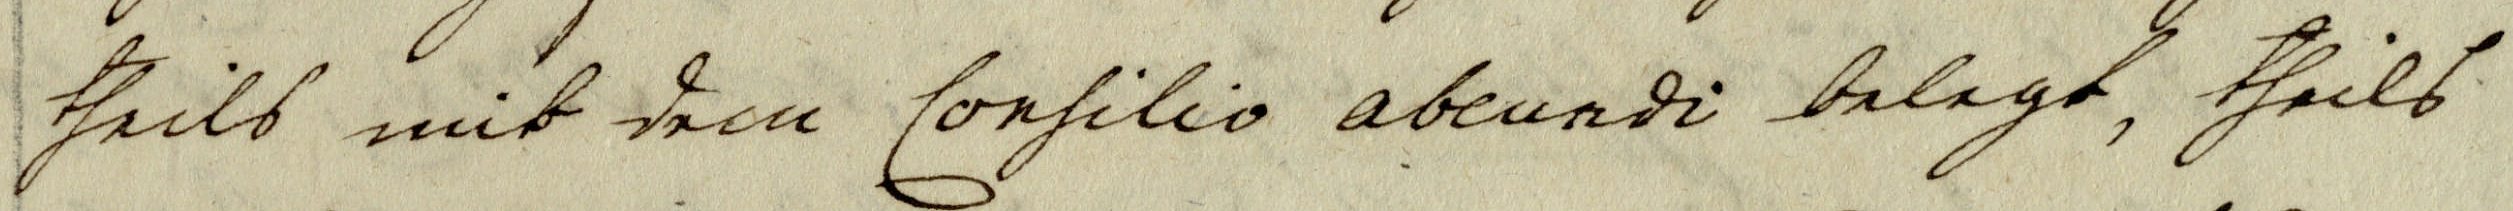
theils mit dem Consilio abeundi belegt, theils
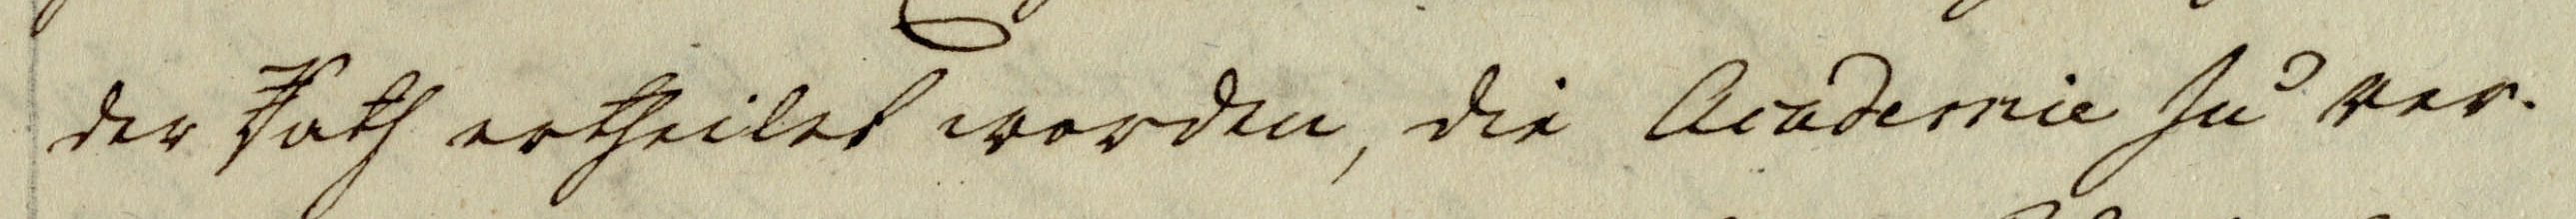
der Rath ertheilet worden, die Academie zu ver¬
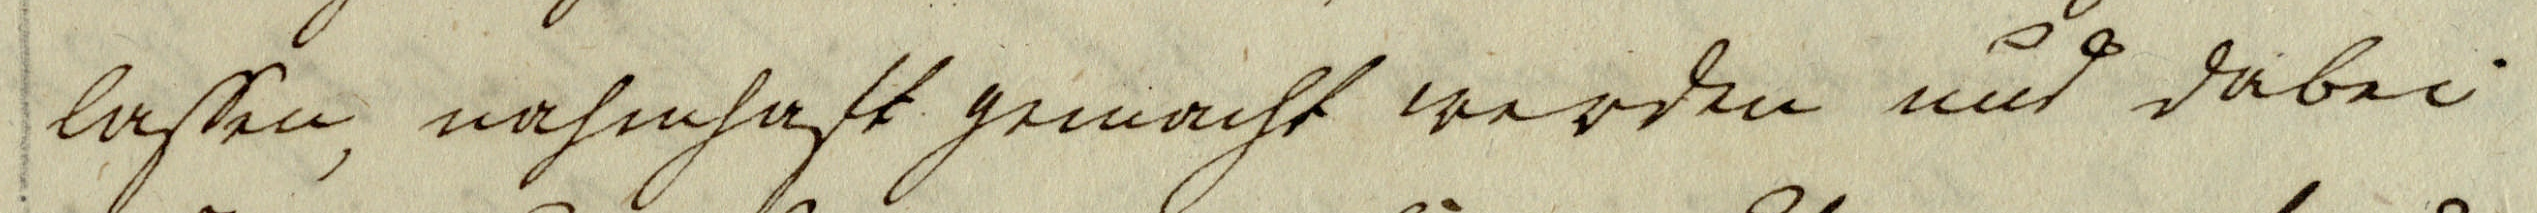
lassen, nahmhaft gemacht werden und dabei
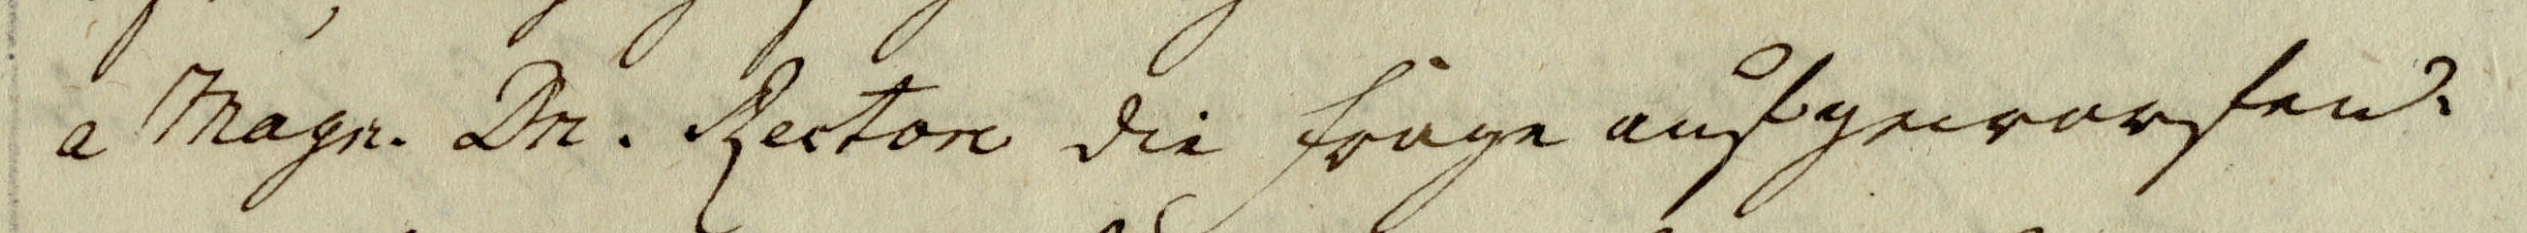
a Magn. Dn. Rectore die Frage aufgeworfen:
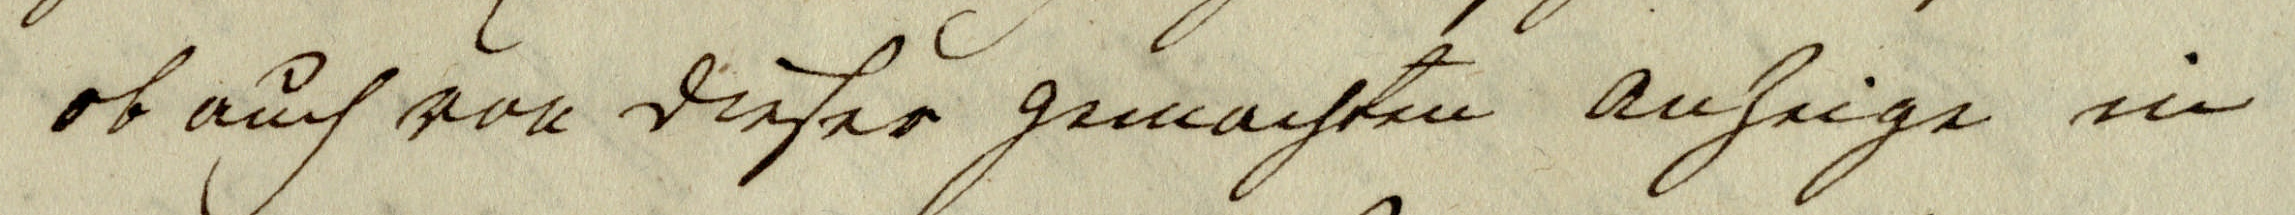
ob auch von dieser gemachten Anzeige in
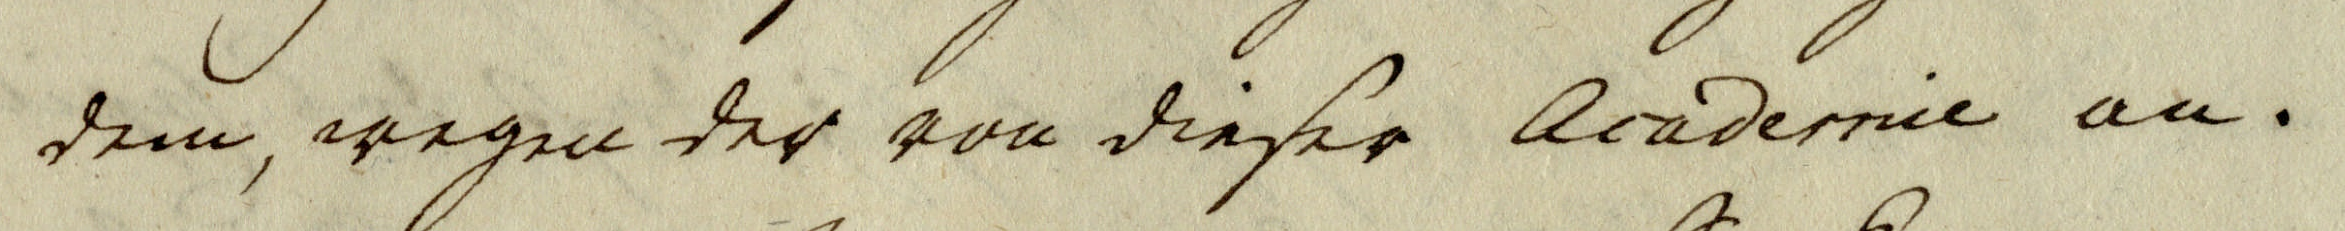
dem, wegen der von dieser Academie an¬
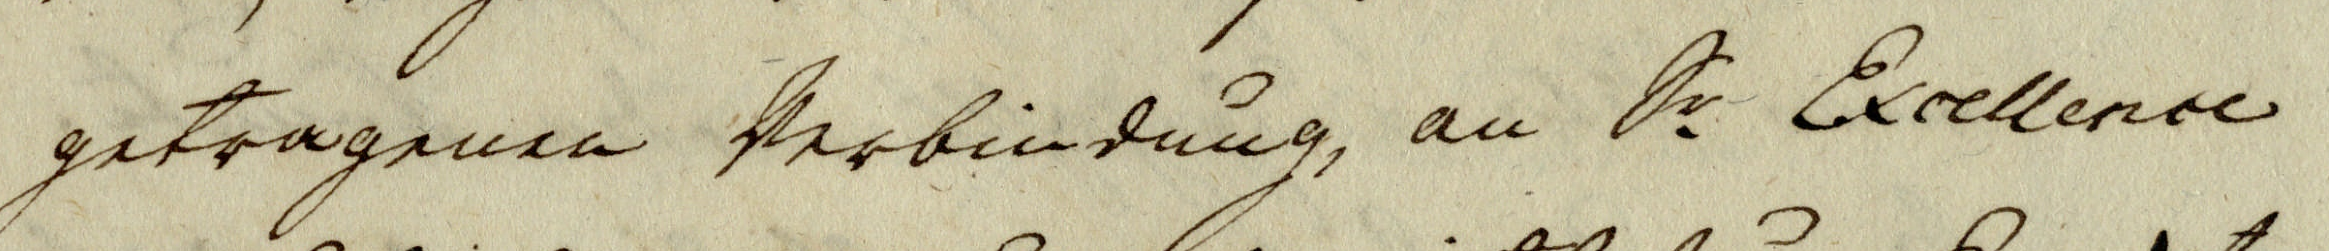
getragenen Verbindung, an Sr. Excellence
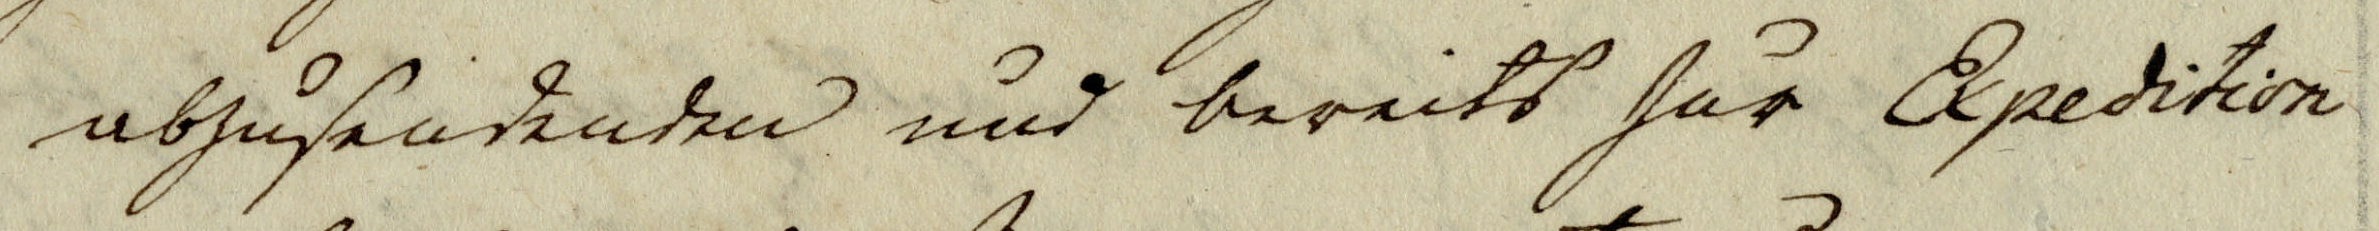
abzusendenden und bereits zur Expedition
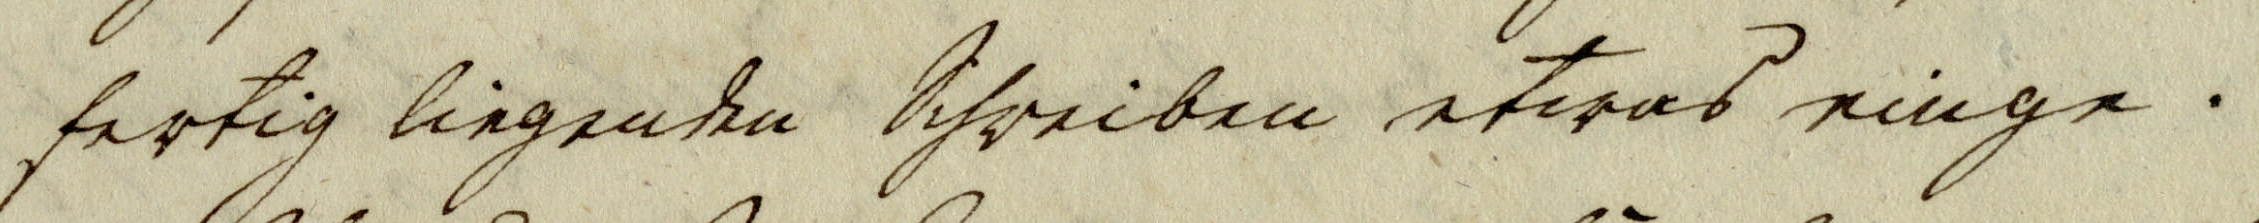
fertig liegenden Schreiben etwas einge¬
